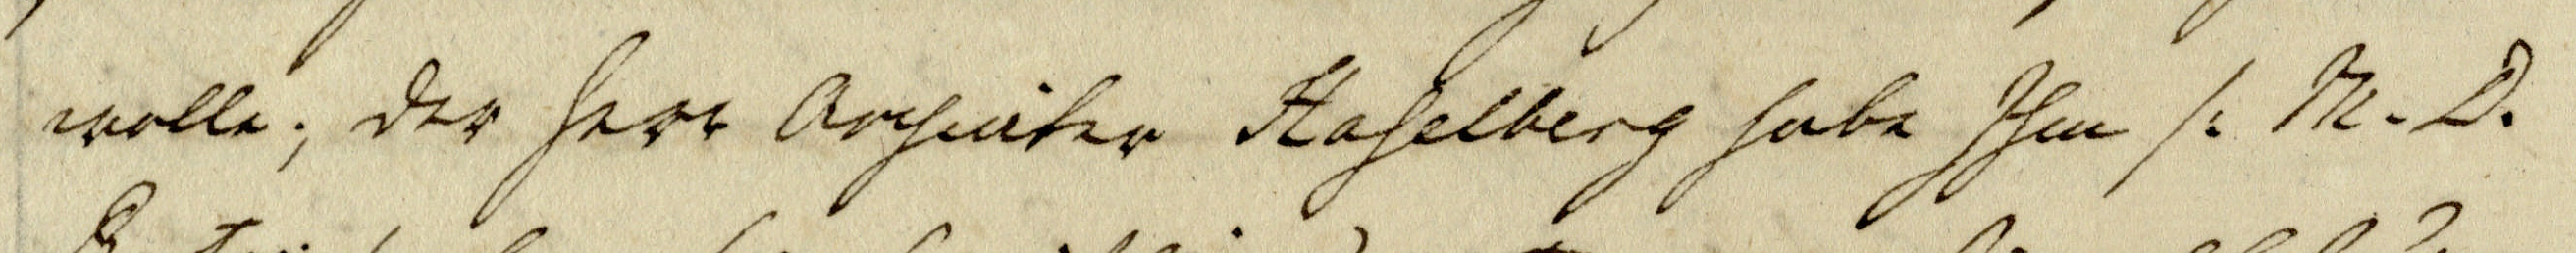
wolle; der Herr Archiater Haselberg habe Ihm /: M. D.
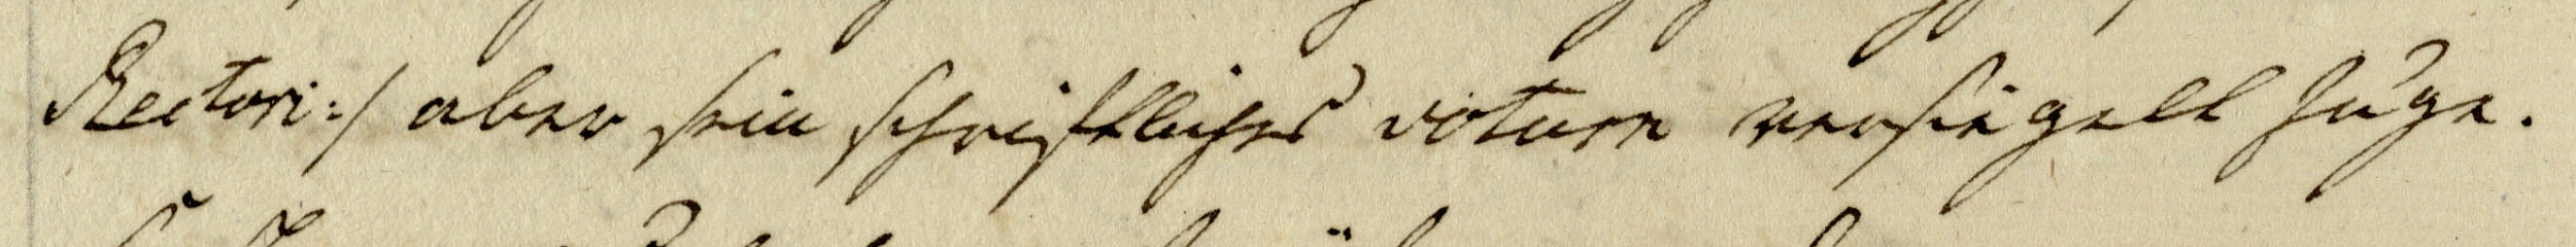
Rectori :/ aber sein schriftliches votum versiegelt zuge¬
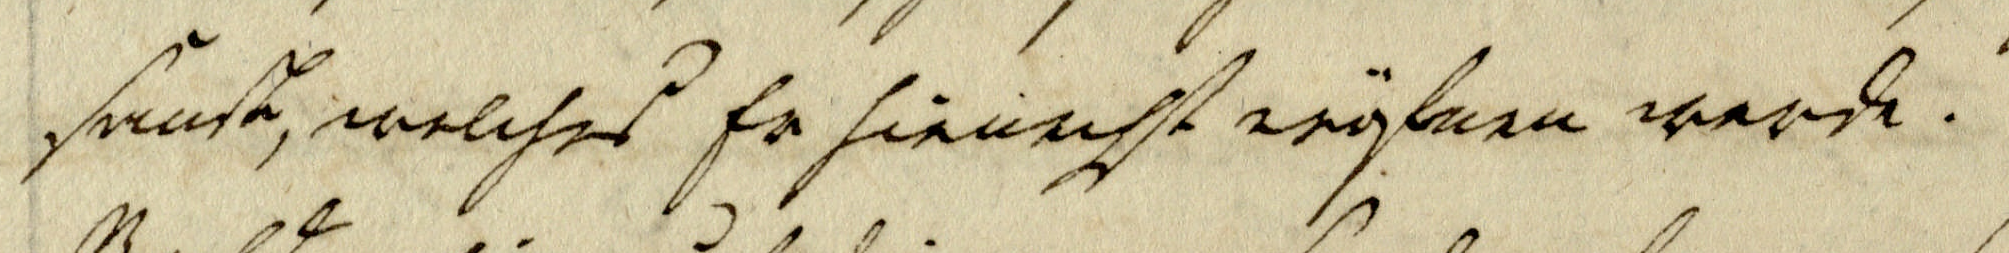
sandt, welches Er hienechst eröfnen werde.
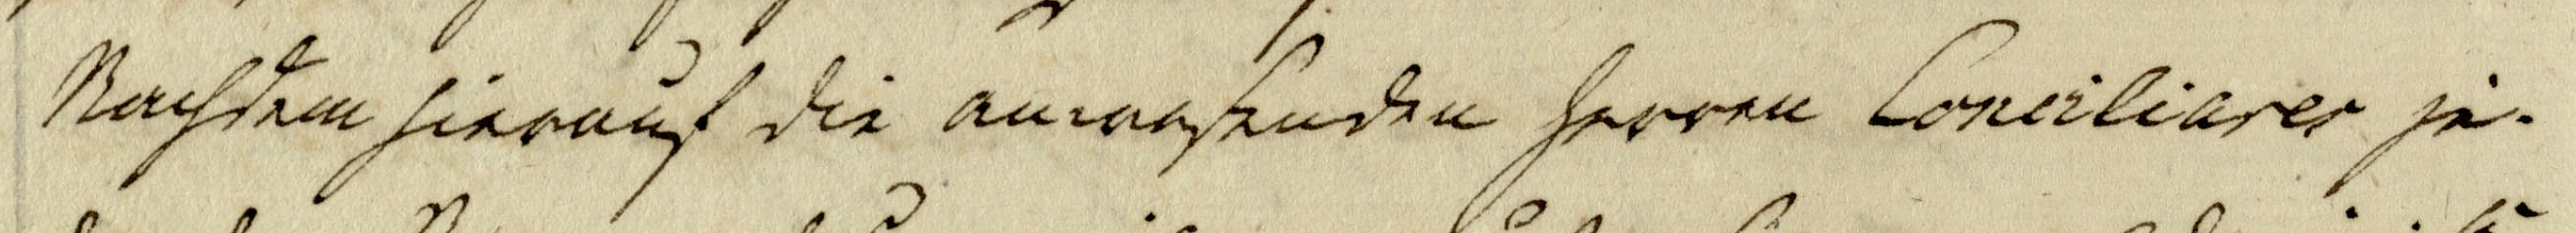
Nachdem hierauf die anmmrsenden Herren Conciliares je¬
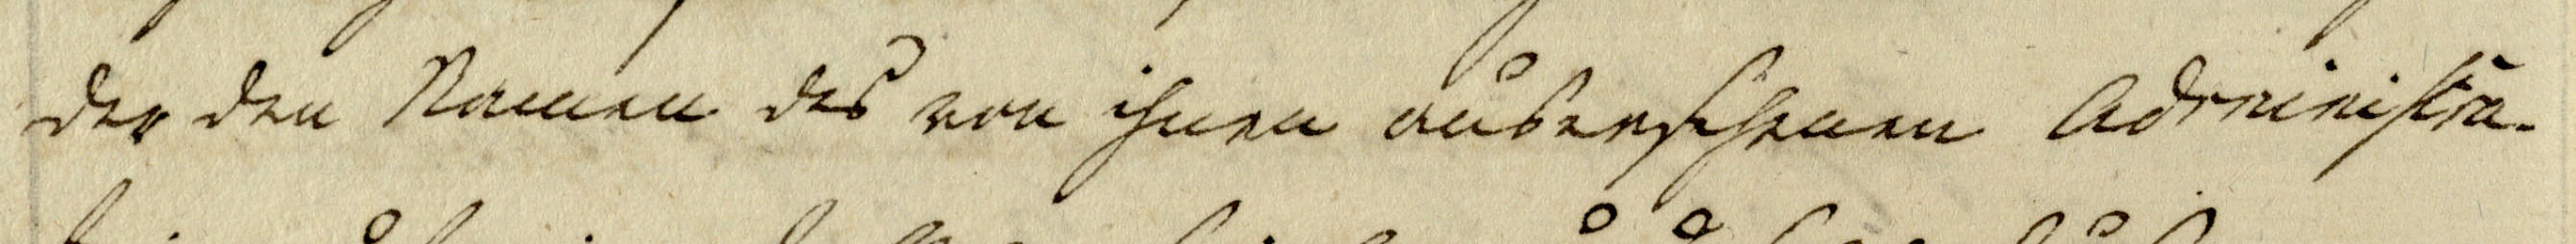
der den Namen des von ihnen ausersehenen Administra¬
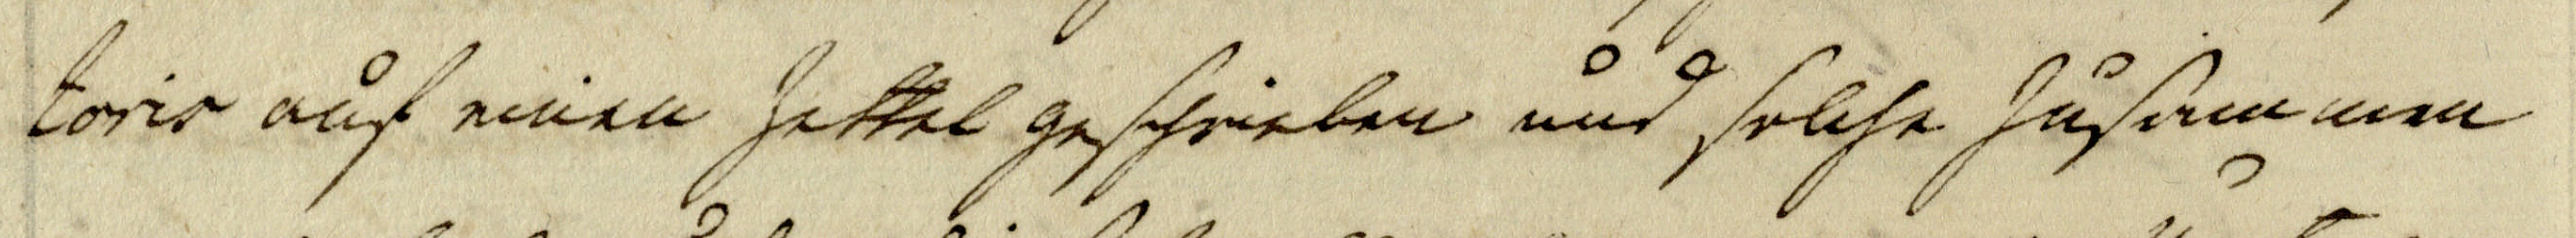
toris auf einen Zettel geschrieben und solche zusammen
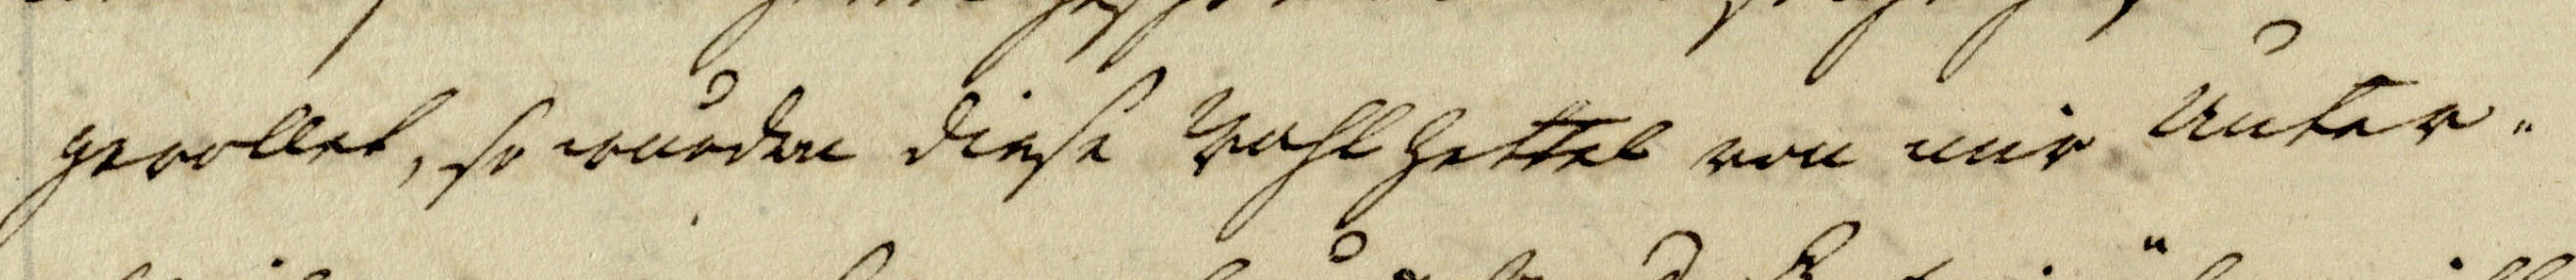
gerollet, so wurden diese Wahl Zettel von mir Unter¬
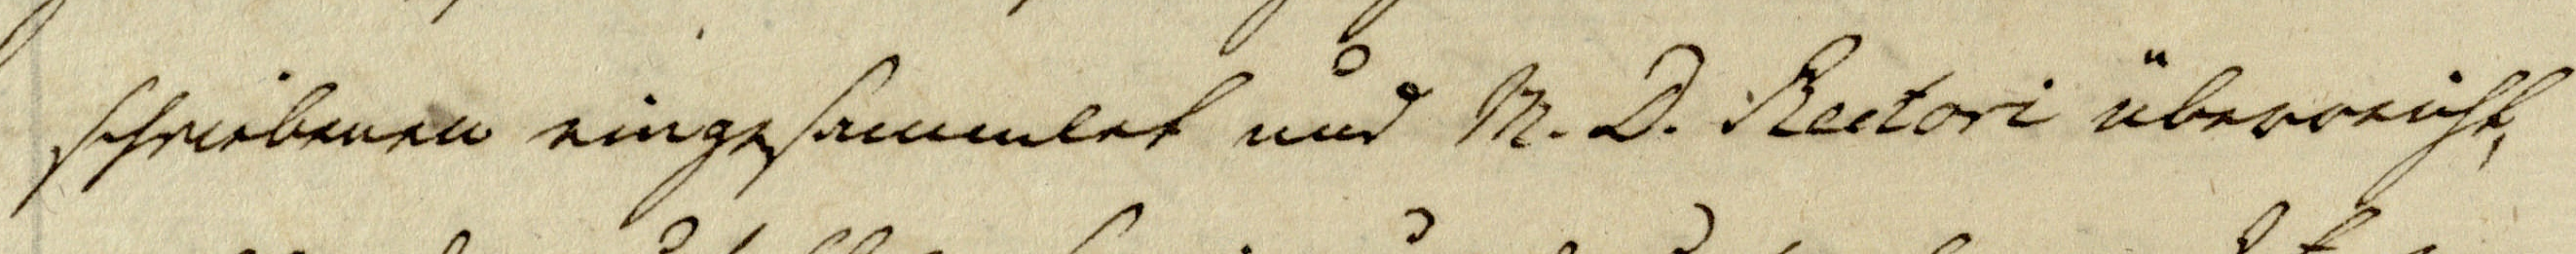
schriebenen eingesammlet und M. D. Rectori überreicht,
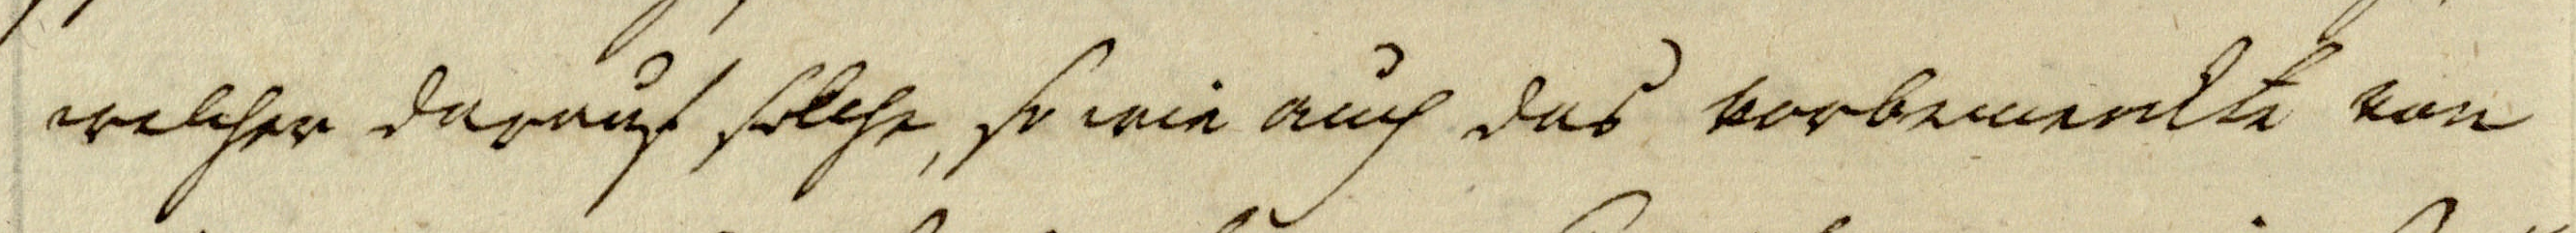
welcher darauf solche, so wie auch das vorbemerckte von
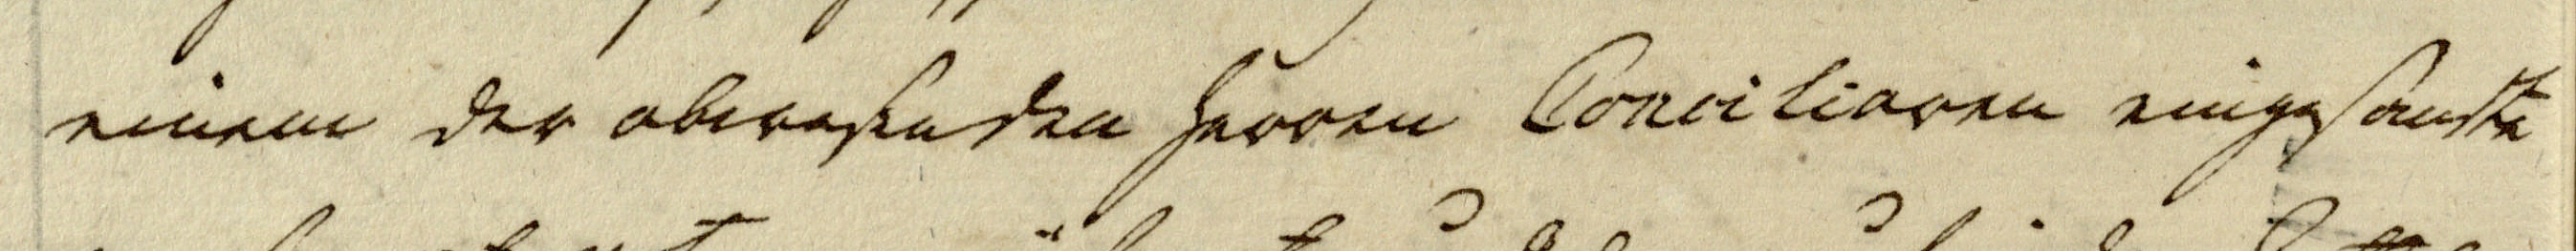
einem der abwesenden Herren Conciliaren eingesandte
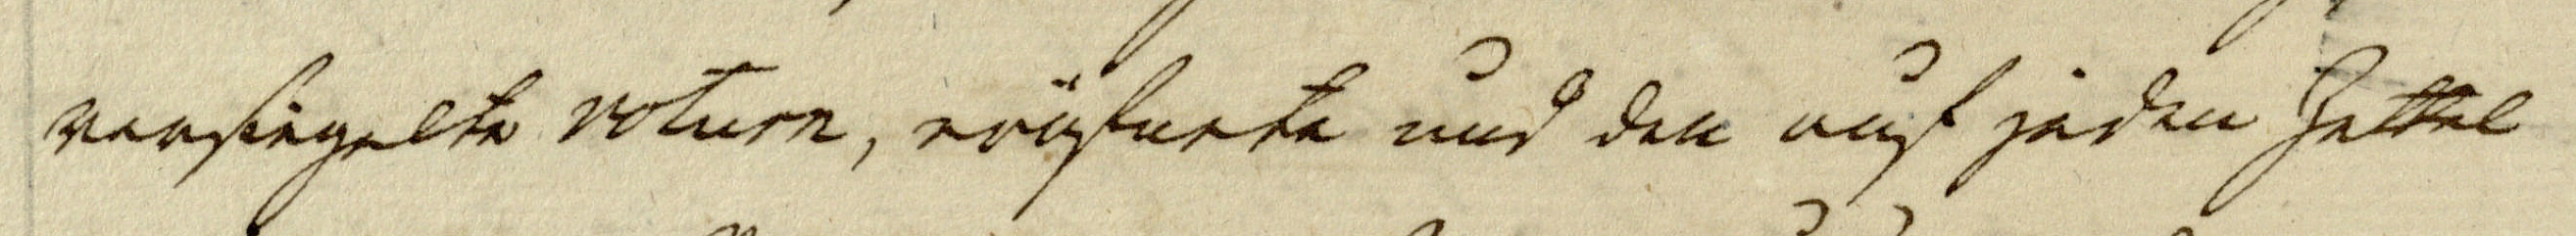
versiegelte votum, eröfnete und den auf jeden Zettel
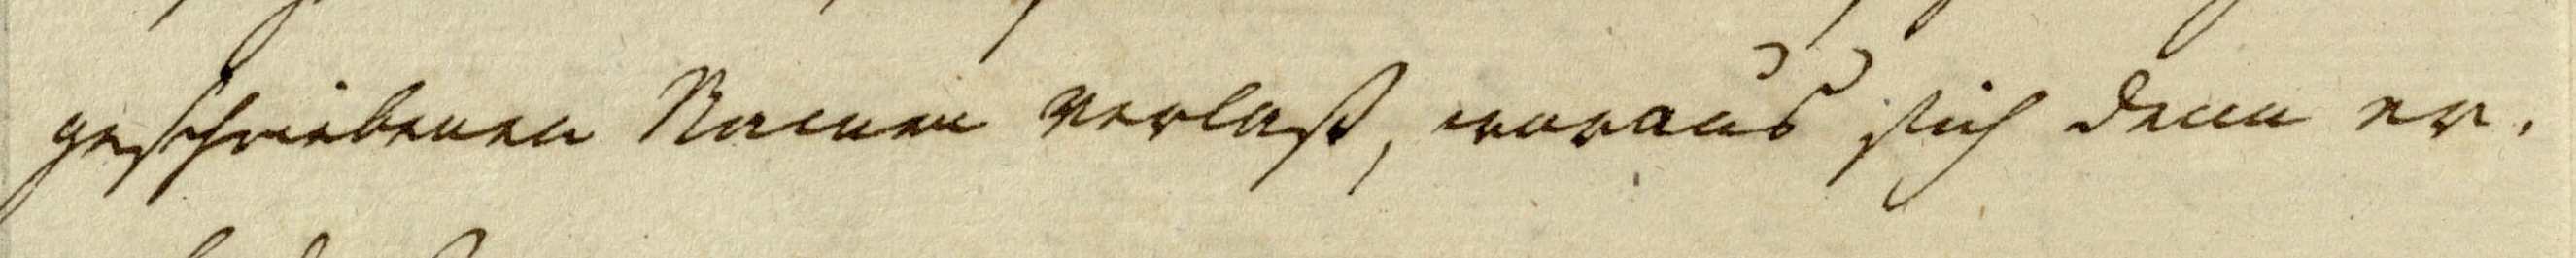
geschriebenen Namen verlas, woraus sich denn er¬
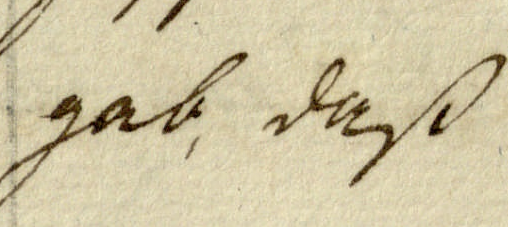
gab, daß
